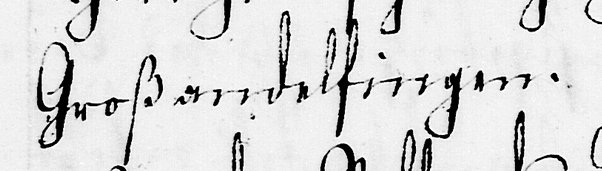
Großandelfingen.
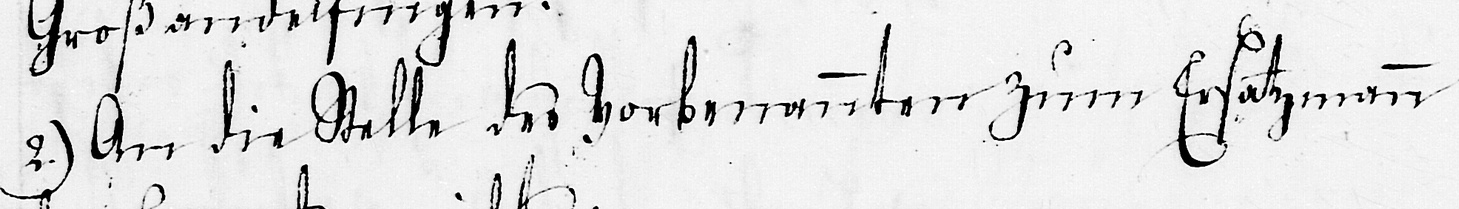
2.) An die Stelle des Vorbenannten zum Ersatzmann
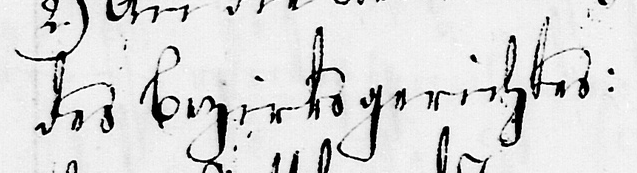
des Bezirksgerichtes:
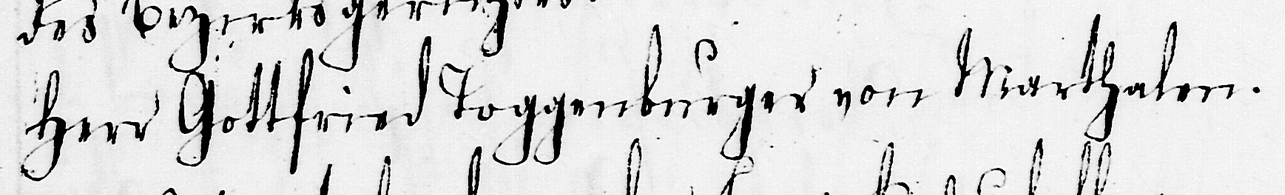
Herr Gottfried Toggenburger von Marthalen.
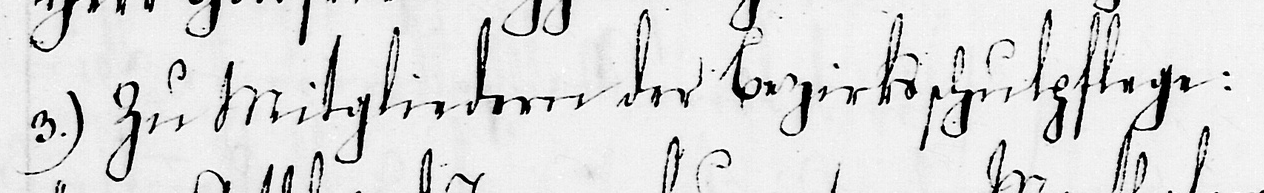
3.) Zu Mitgliedern der Bezirksschulpflege:
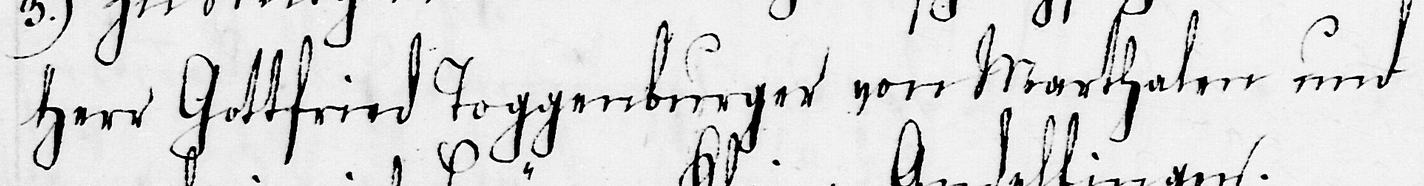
Herr Gottfried Toggenburger von Marthalen und
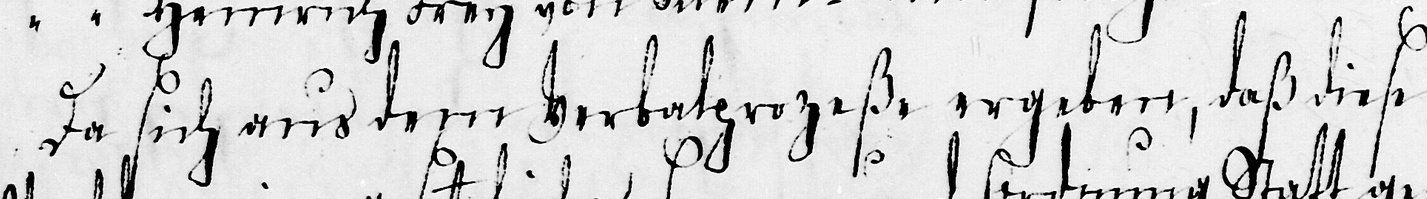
Da sich aus dem Verbalprozeße ergeben, daß diese
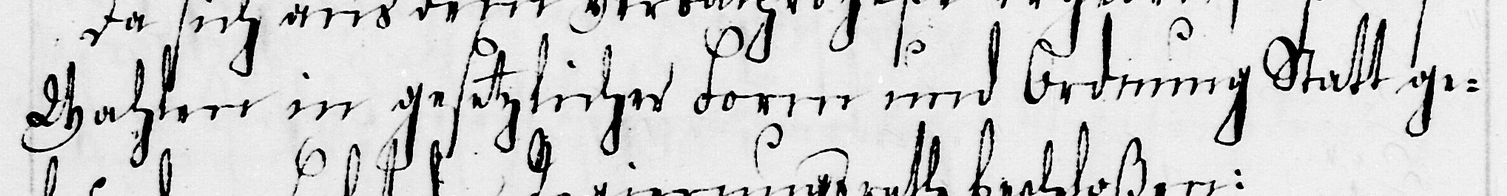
Wahlen in gesetzlicher Form und Ordnung Statt ge¬
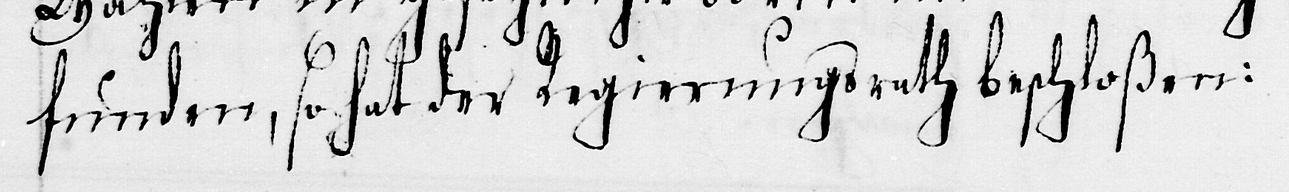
funden, so hat der Regierungsrath beschloßen:
